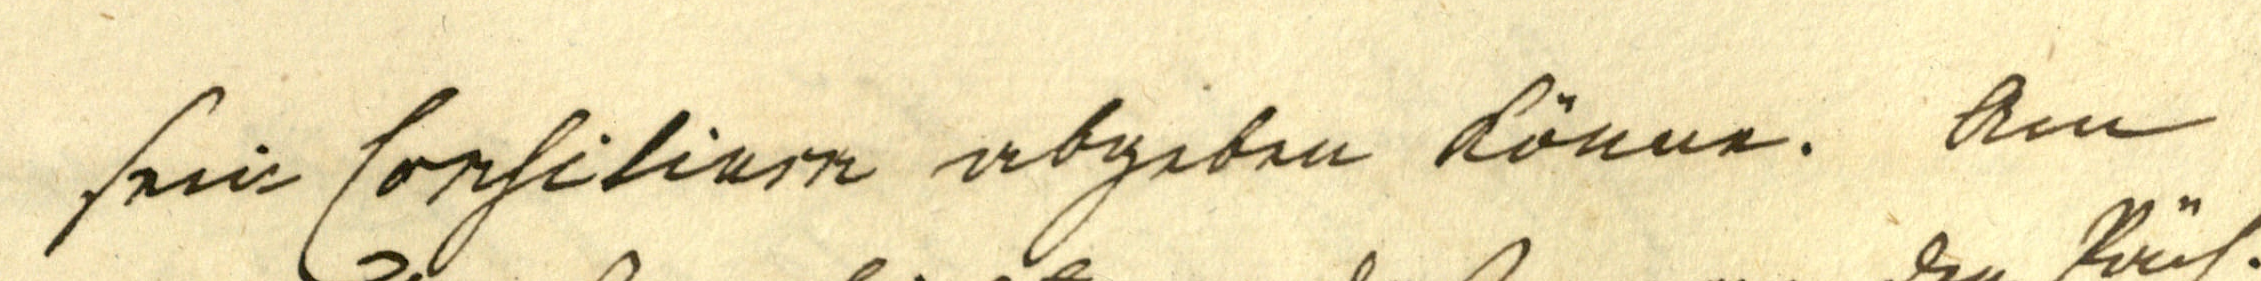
sein Consilium abgeben könne. Am
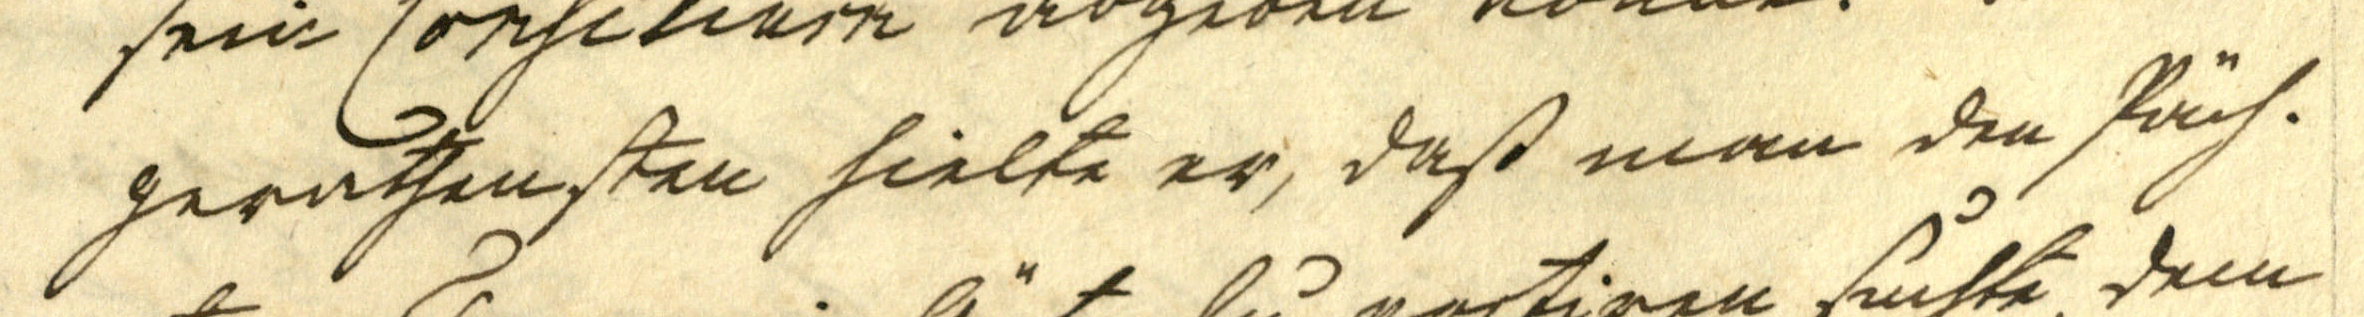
gerathensten hielte er, daß man den Päch¬
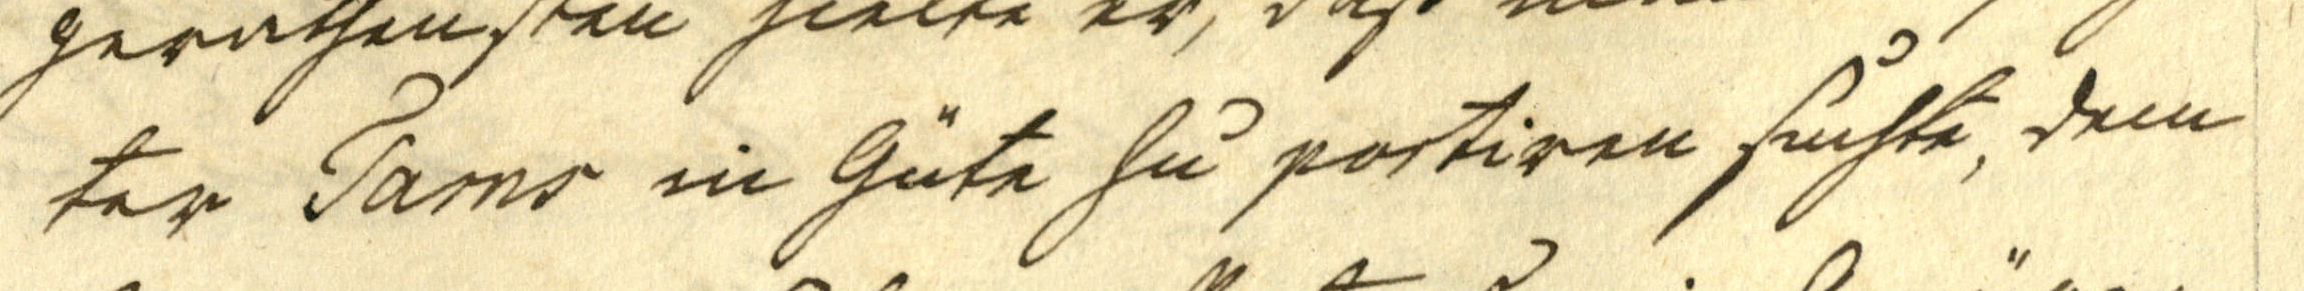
ter Tams in Güte zu portiren suchte, dem
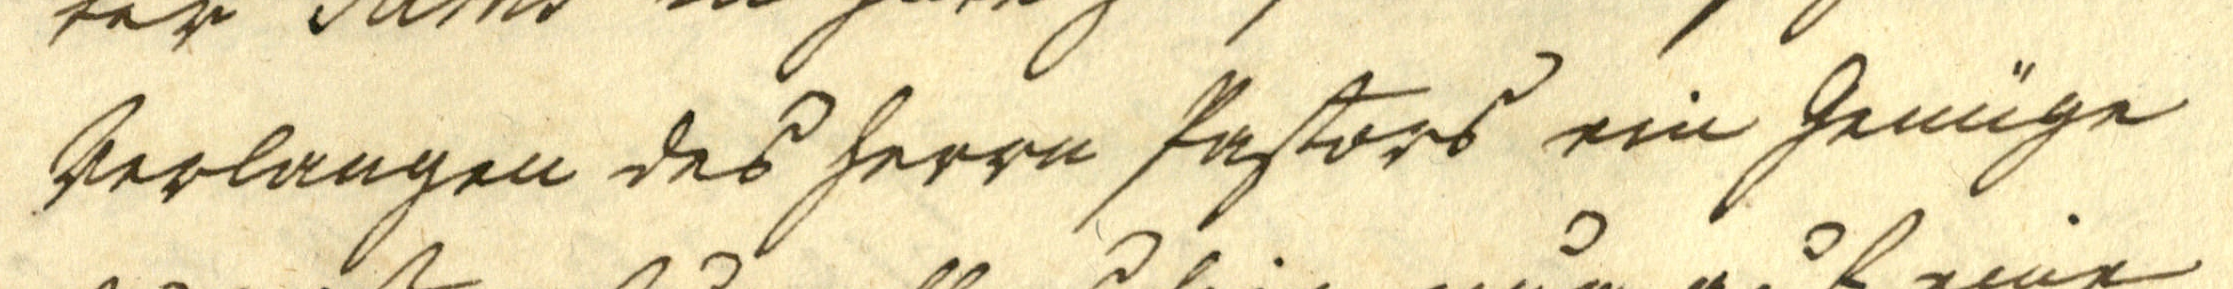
Verlangen des Herrn Pastors ein Genüge
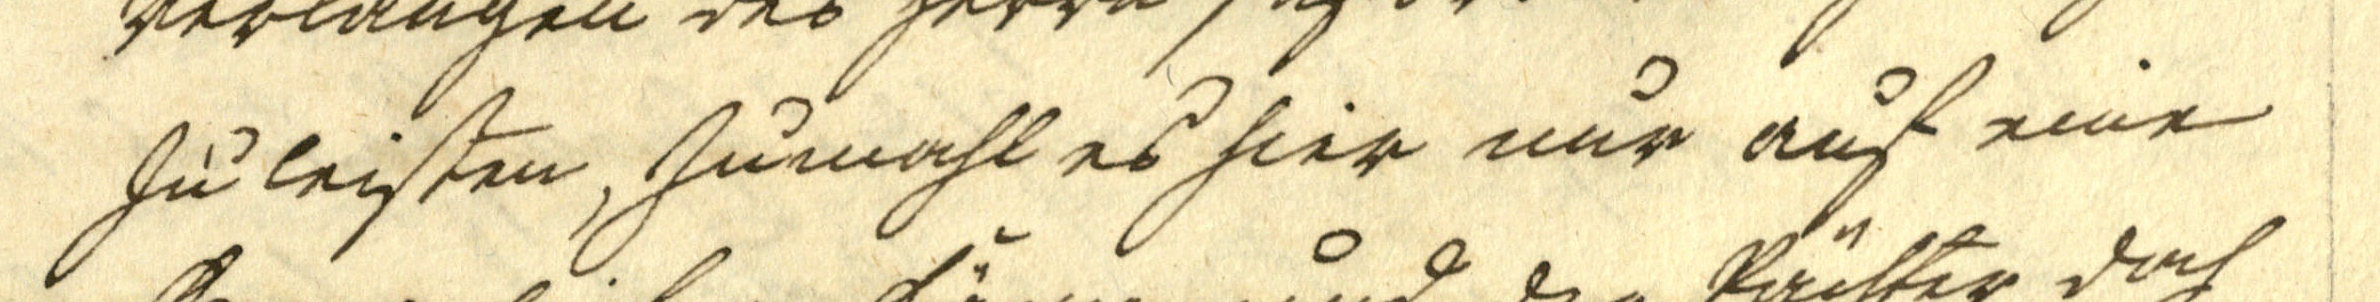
zu leisten, zumahl es hier nur auf eine
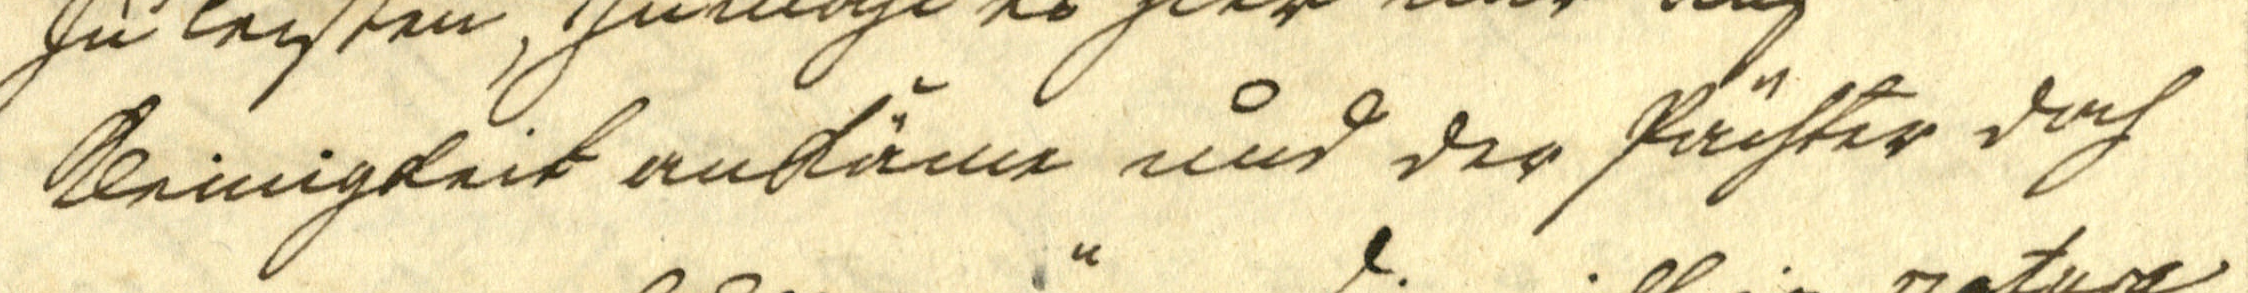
Kleinigkeit ankäme und der Pächter doch
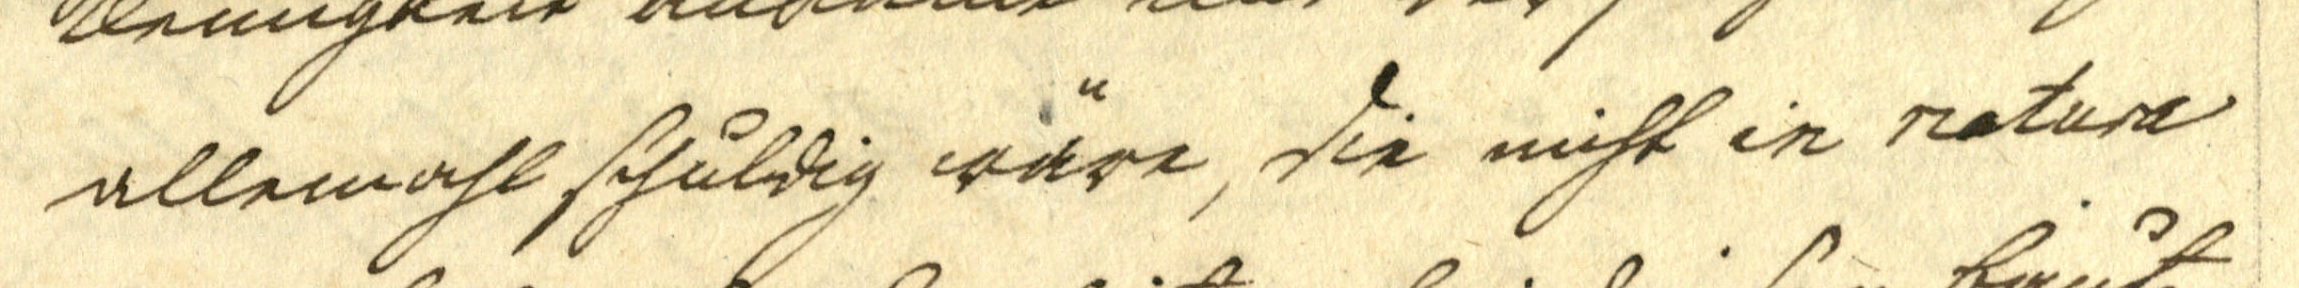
allemahl schuldig wäre, die nicht in natura
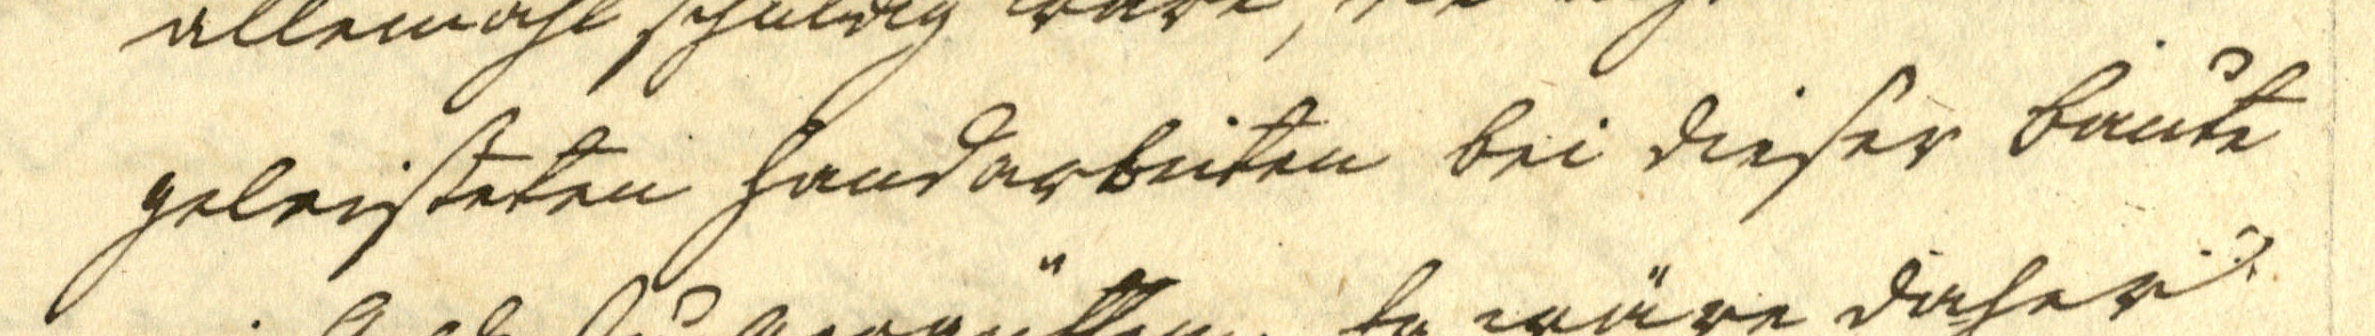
geleisteten Handarbeiten bei dieser Baute
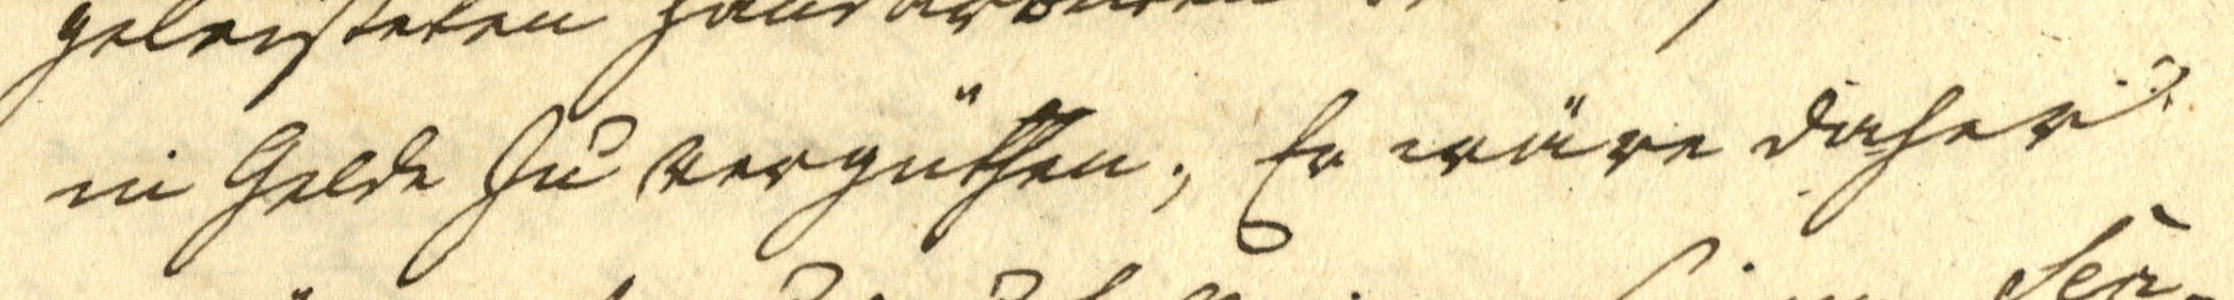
in Gelde zu vergüthen; Er wäre daher
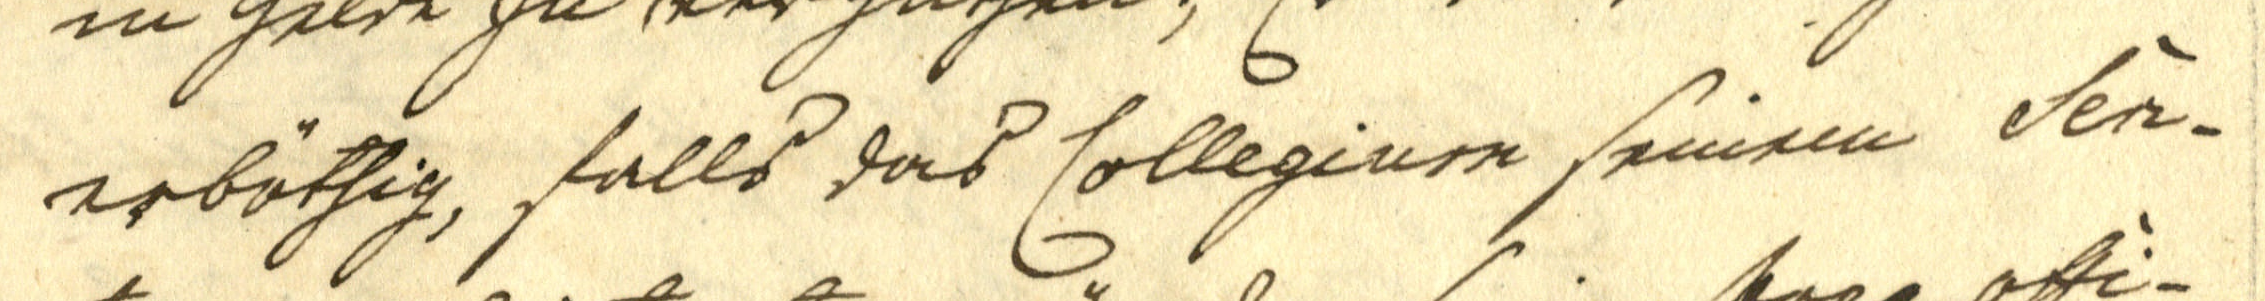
erböthig, falls das Collegium seinem Sen¬
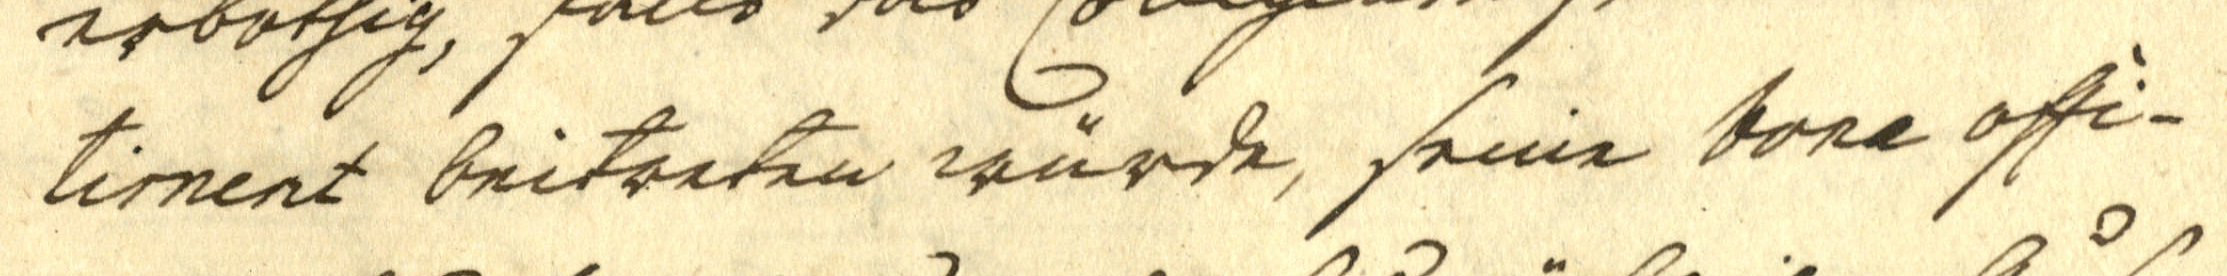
timent beitreten würde, seine von offi¬
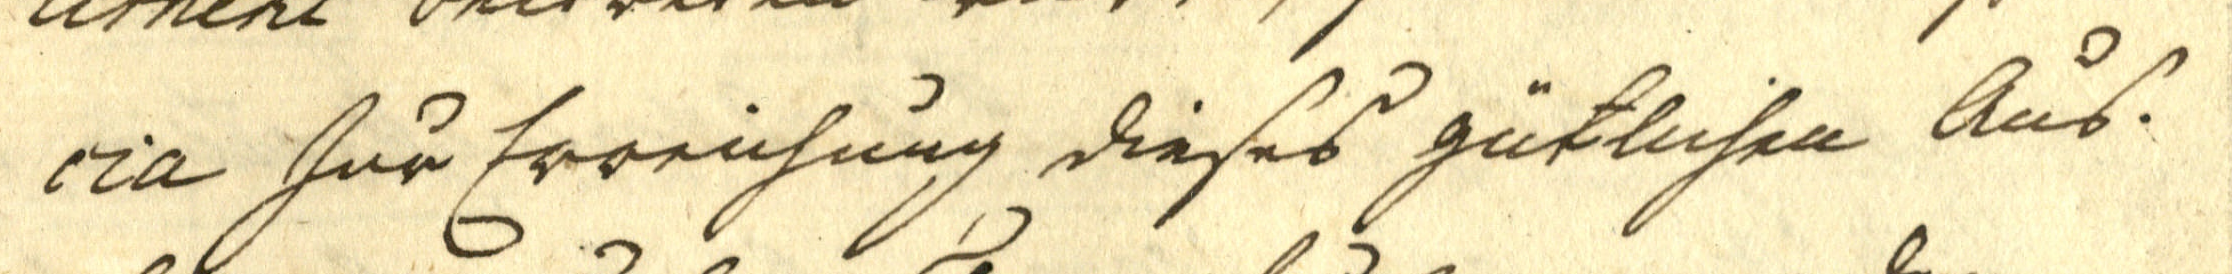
cia zur Erreichung dieses gütlichen Aus¬
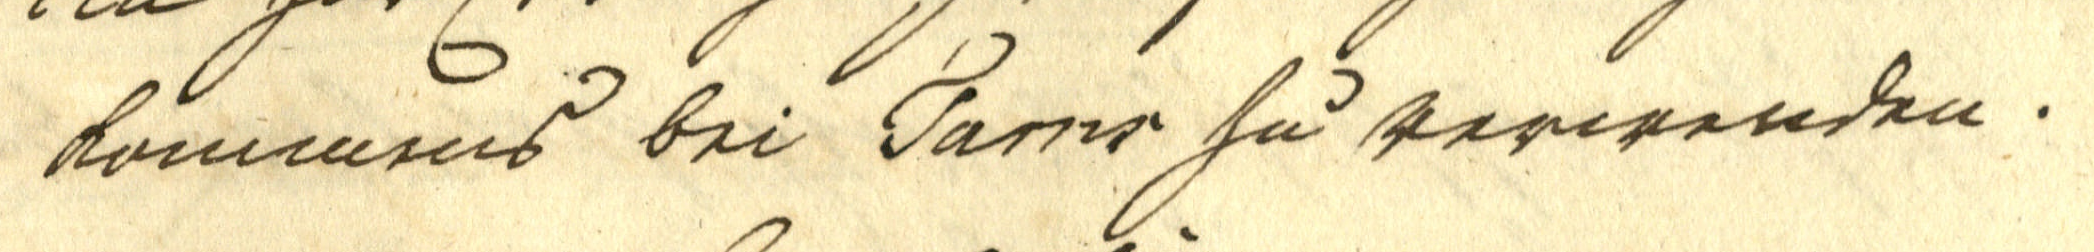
kommens bei Tams zu verwenden.
